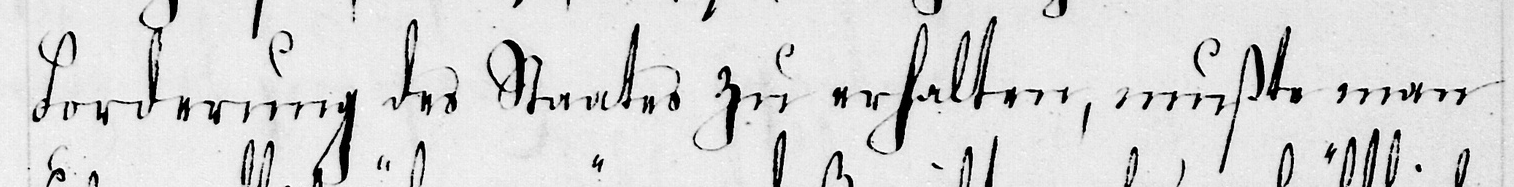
Forderung des Staates zu erhalten, mußte man
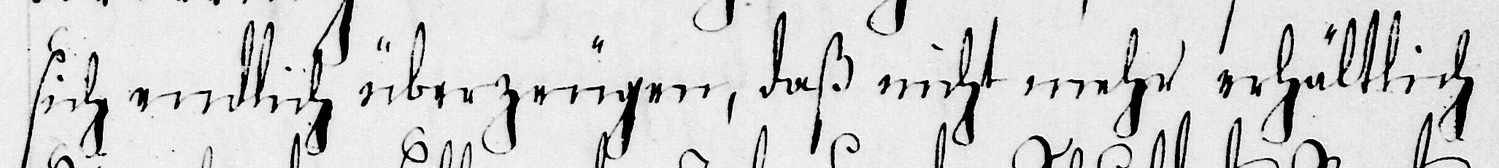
sich endlich überzeugen, daß nicht mehr erhältlich
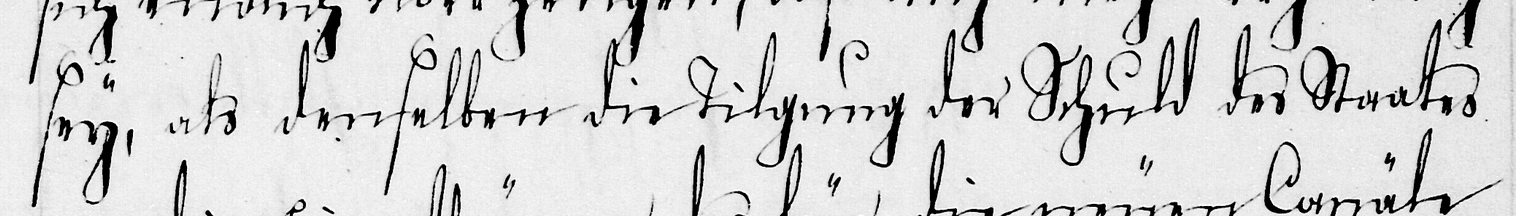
sey, als denselben die Tilgung der Schuld des Staates
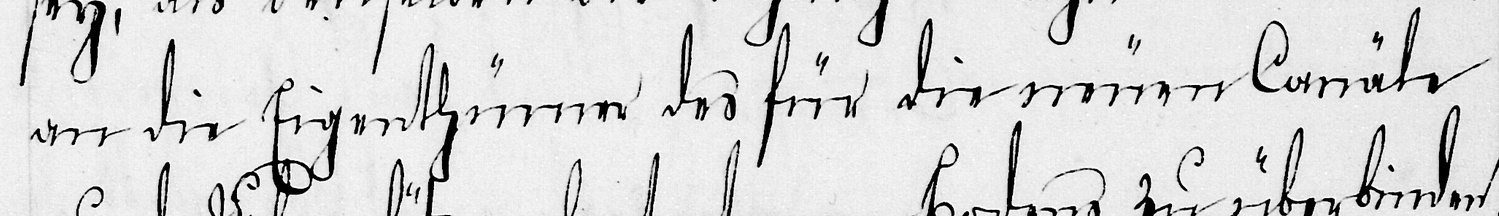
an die Eigenthümer des für die neuen Canäle
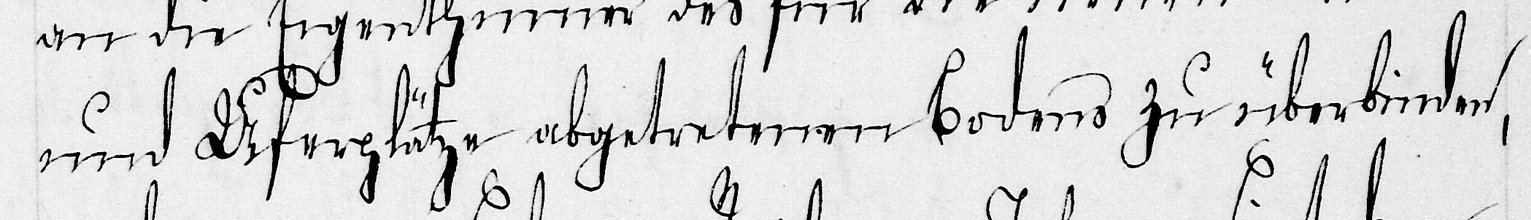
und Uferplätze abgetretenen Bodens zu überbinden,
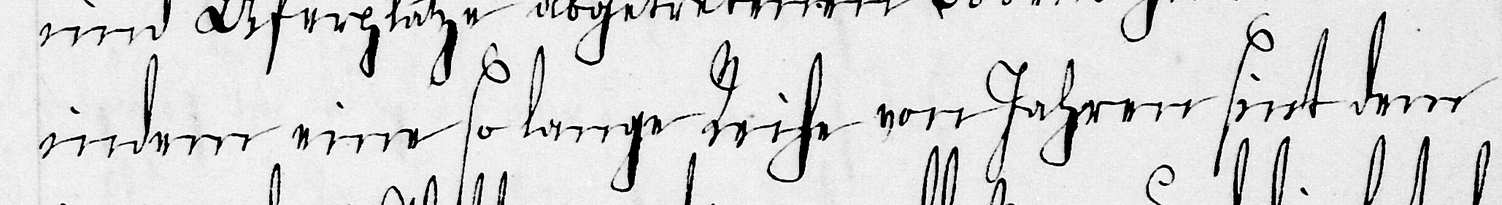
indem eine so lange Reihe von Jahren seit dem
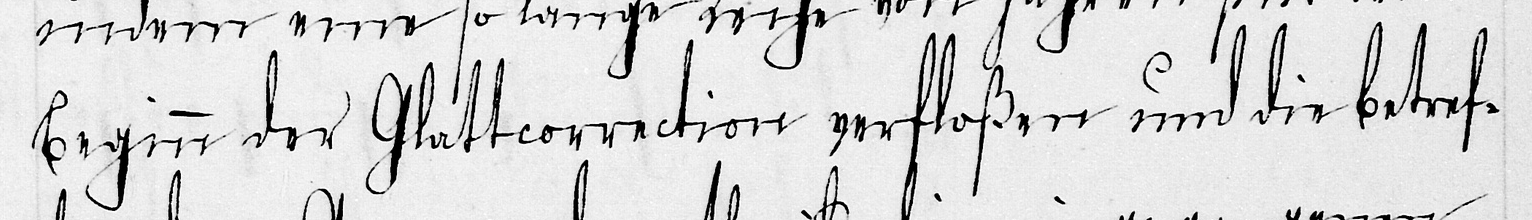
Beginn der Glattcorrection verfloßen und die betref¬
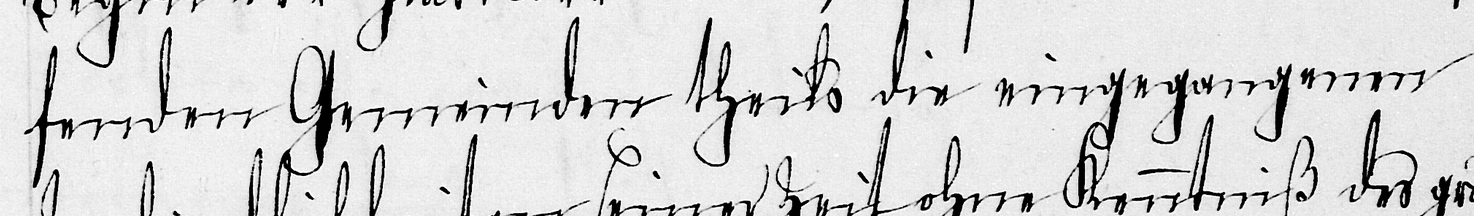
fenden Gemeinden theils die eingegangenen
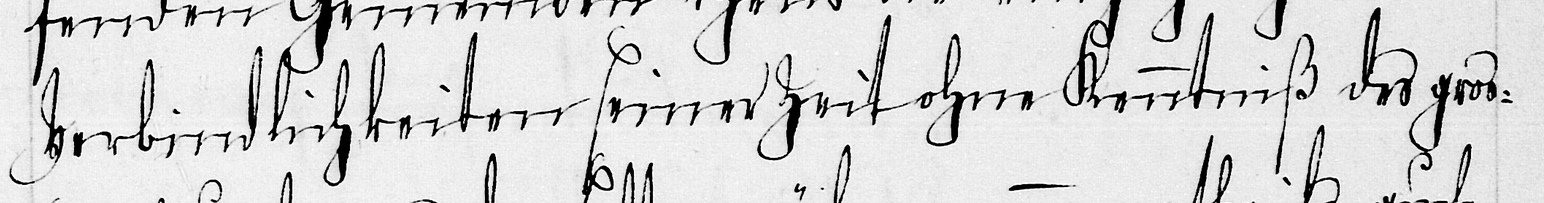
Verbindlichkeiten seiner Zeit ohne Kenntniß des gro¬
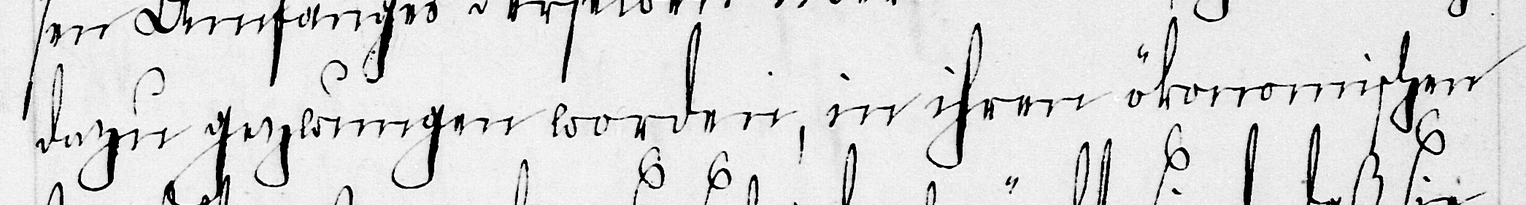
dazu gezwungen worden, in ihren ökonomischen
